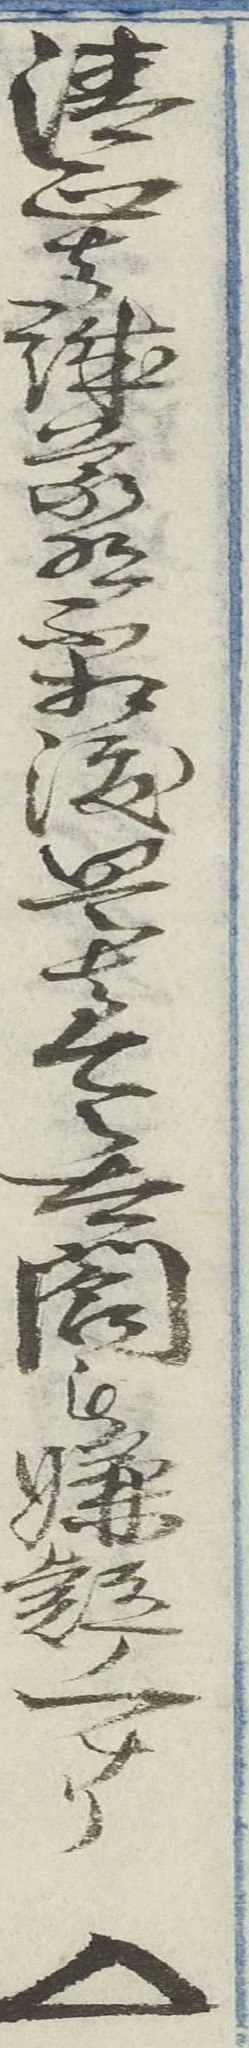清正は誠義有不相渡是は今之太閤も嫌疑ノ一ナリ△
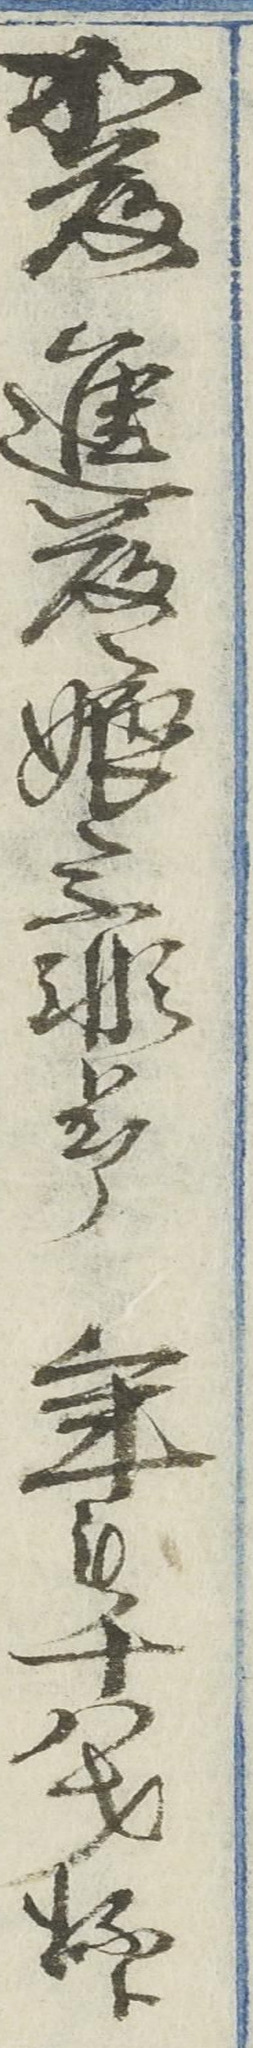加藤進藤之娘ニ不非ト云ウ年も十八才抔ト
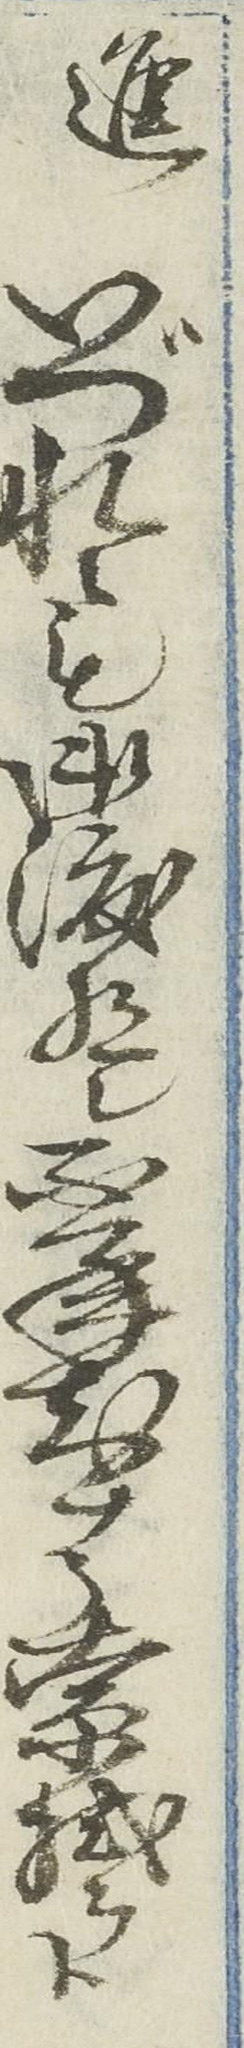進いづれニも御渡有レ不承知ナラ索掛テト
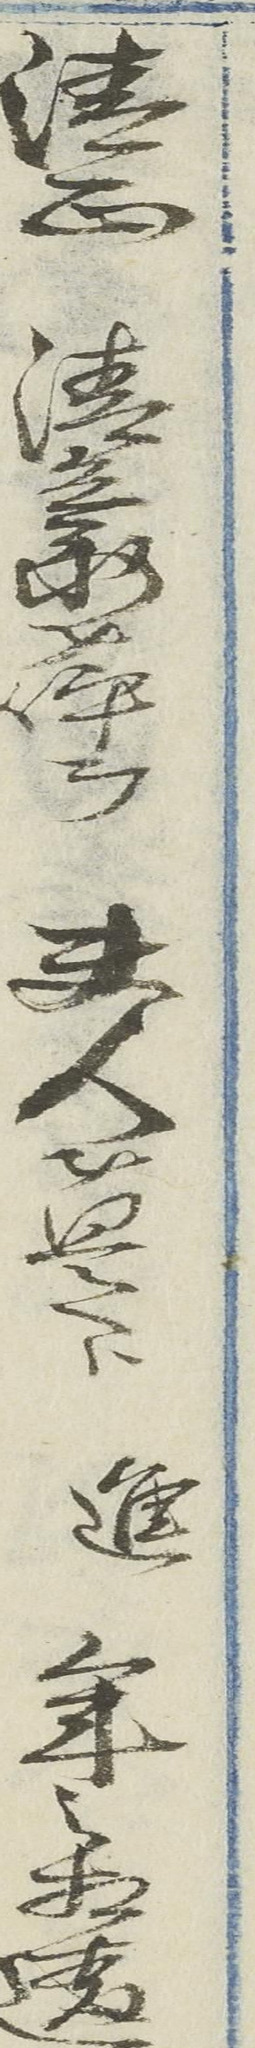清正清兵衛ヲ呼テ夫人ヲ是ヘト進年之相違也
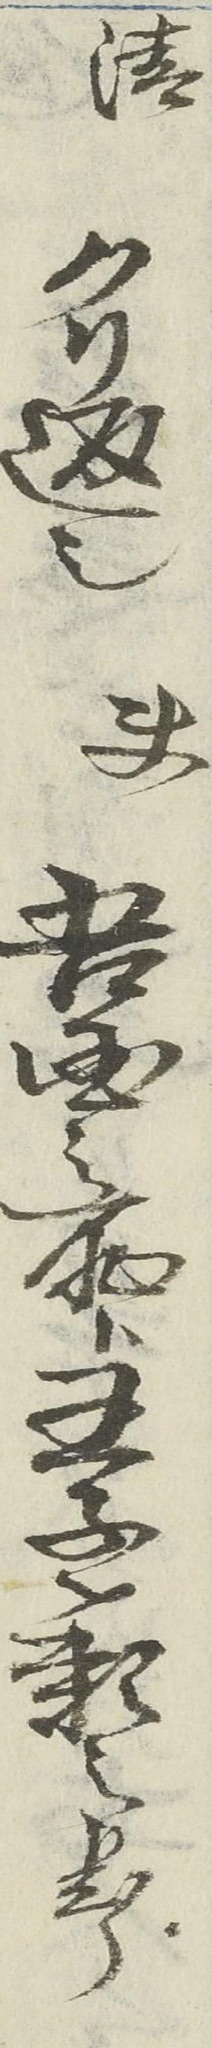清クリ返シ夫吾国之前ト王子ヲ頼シト云ウ
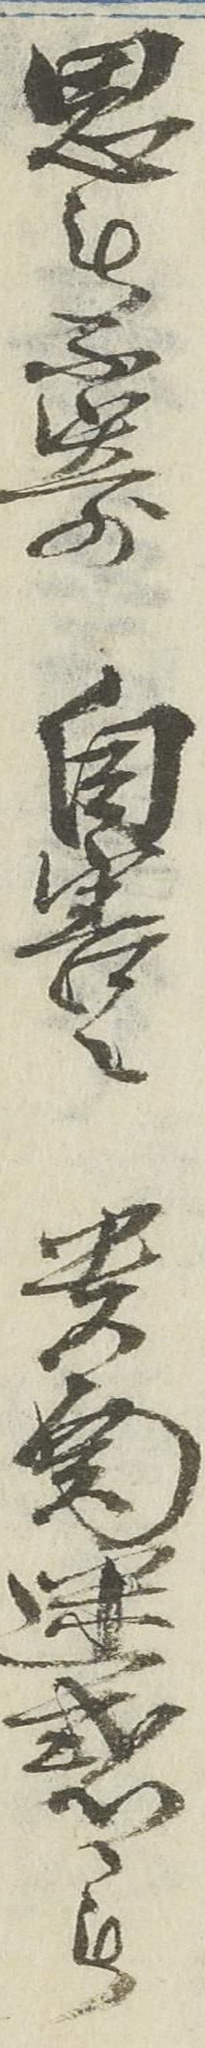思も不寄自害也貴殿迷惑ニも

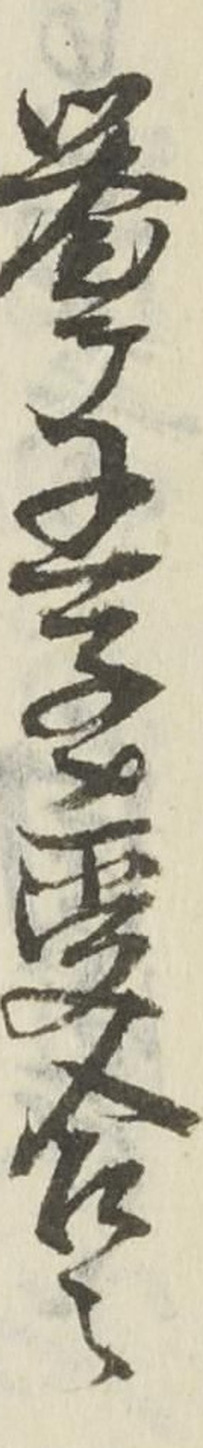清誉テ王子ヲ受合
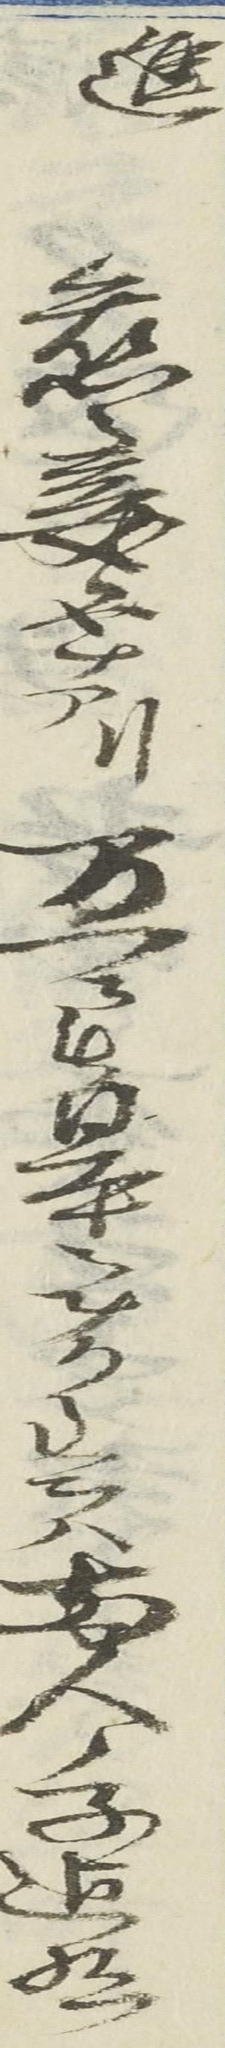進哀妾ヤナア万一ニも日本ニヲクリシテハ両人ノ子迄有
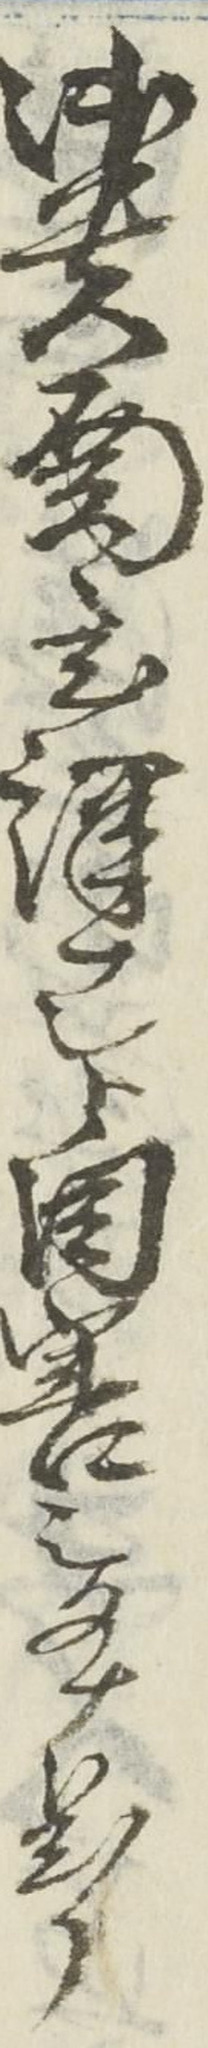御貴殿ニ云譯ナシト自害シタナト云ウ
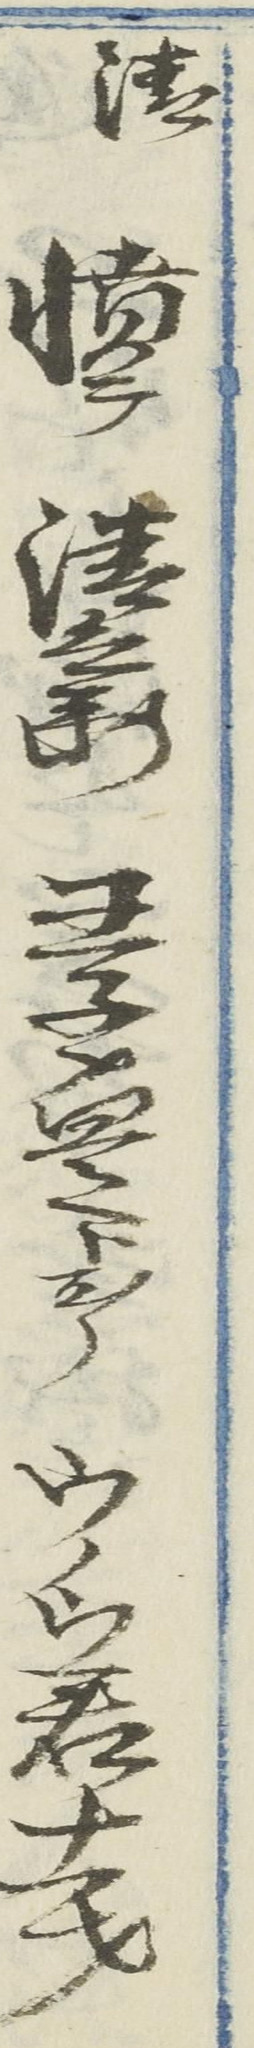清憤テ清兵衛王子ヲ是ヘト云ウウノウ君十一才
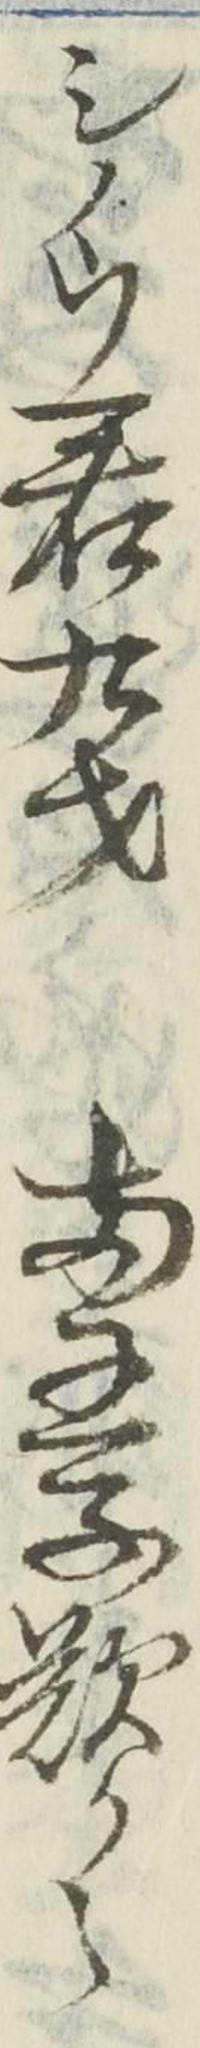シノウ君九才両王子歎ク也
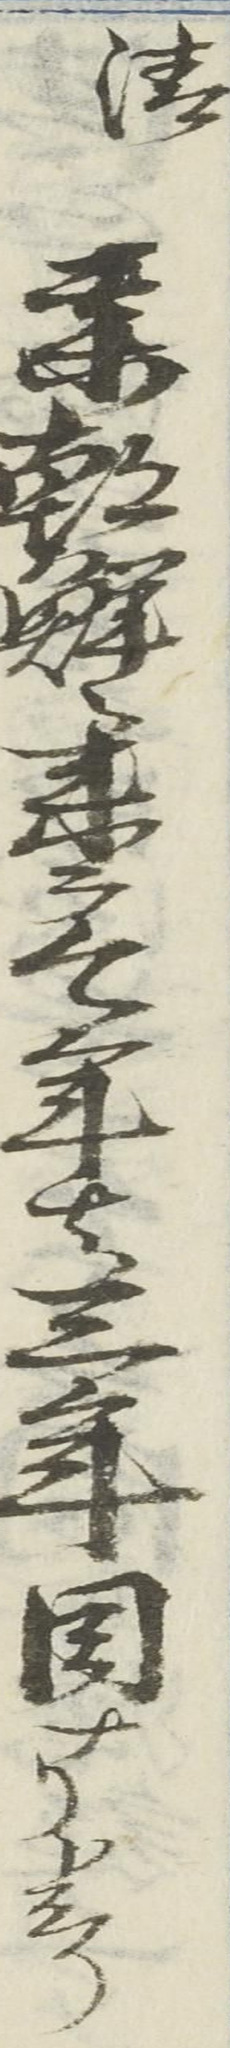清某朝鮮ニ来テ今年は三年目ナリト云ウ
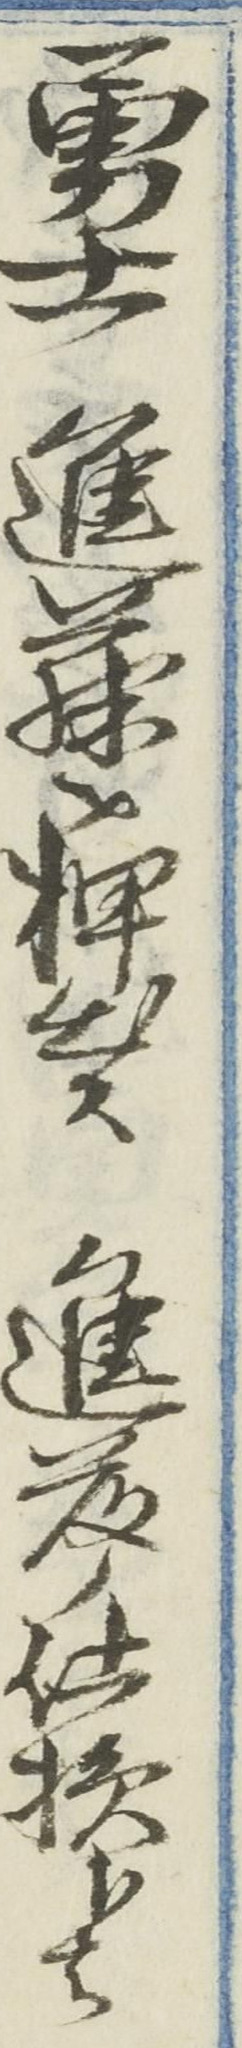勇士進藤ヲ押出ス進藤ノ仕損トは
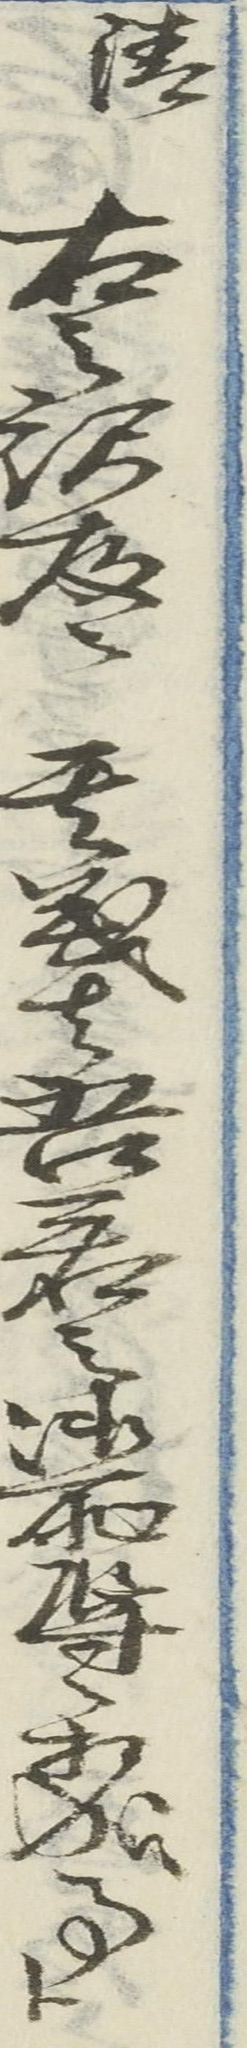清右之訳故ニ其義は吾君之御恥辱ニ相成事ト
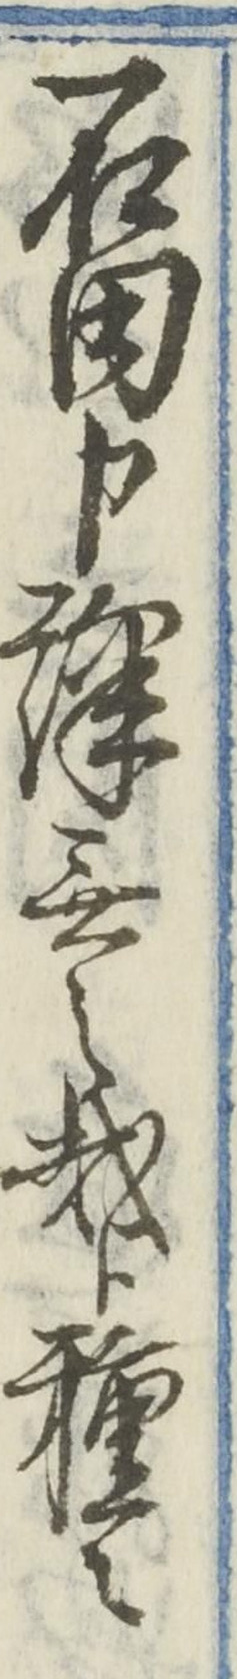石田申譯無シ哉ト種〻
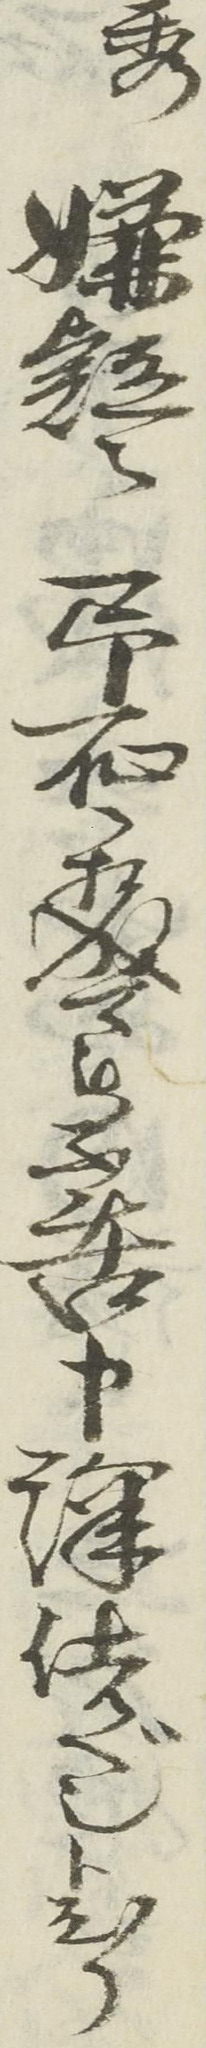秀嫌疑ニ弔恥ニ相成ても不苦申譯仕ルベシト云ウ
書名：伏水大地震
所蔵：東京大学地震研究所図書室 Earthquake Research Institute Library, The University of Tokyo, JAPAN
